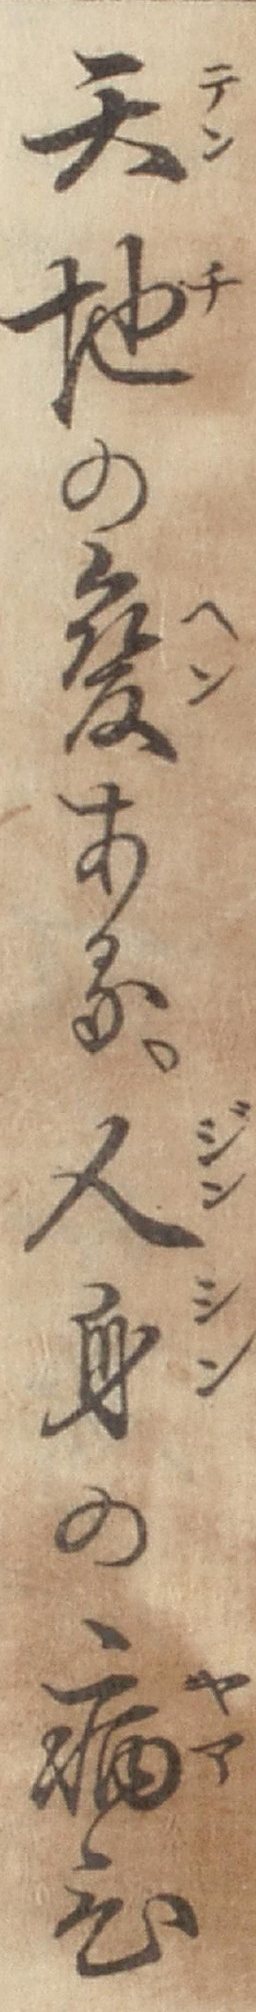天地の変ある。人身の病ひ
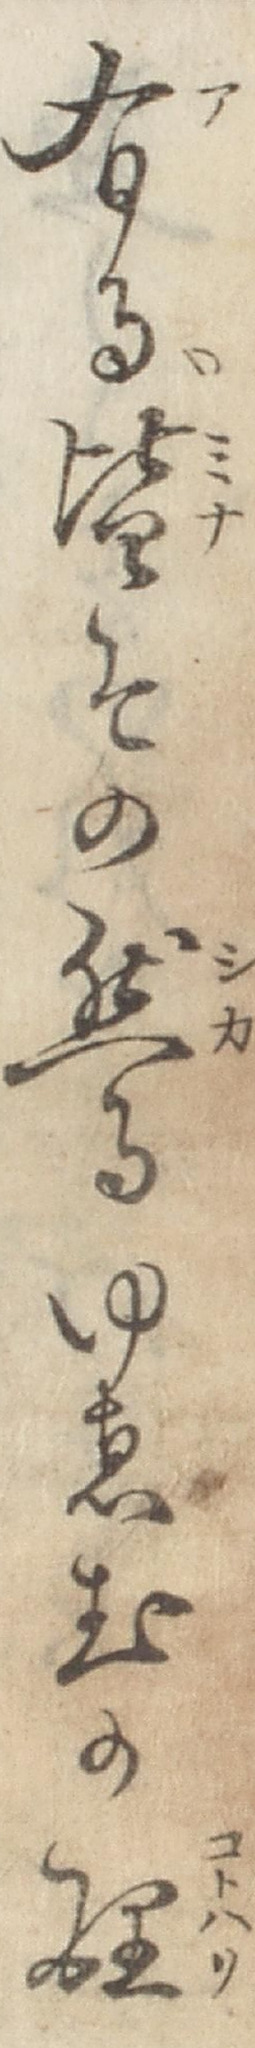有る。皆その然るゆゑむの理
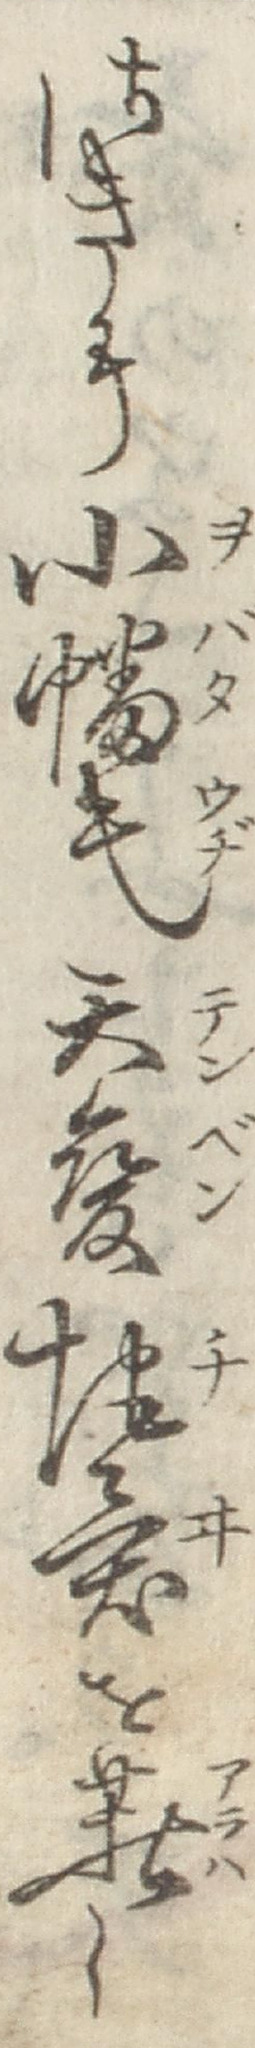さきに小幡氏天変地異を著し
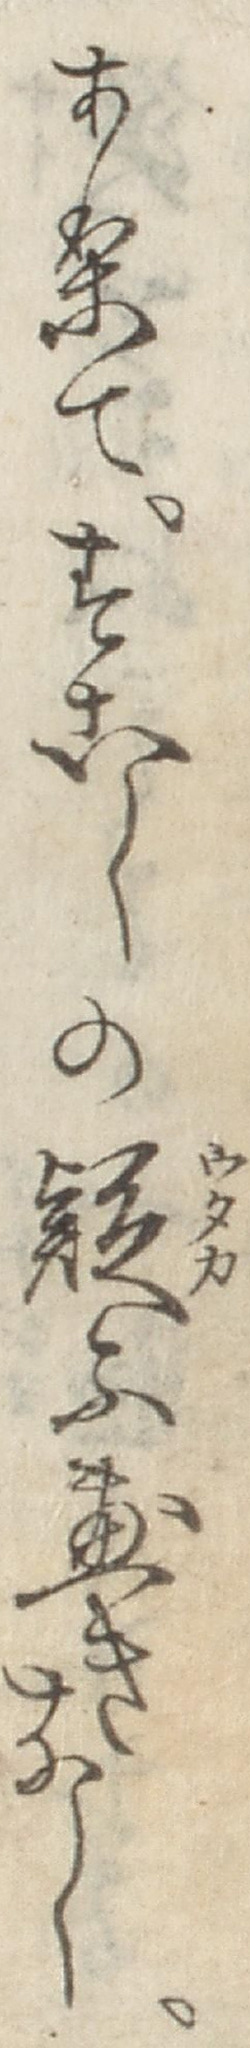ありて。すこしの疑ふへきなし。
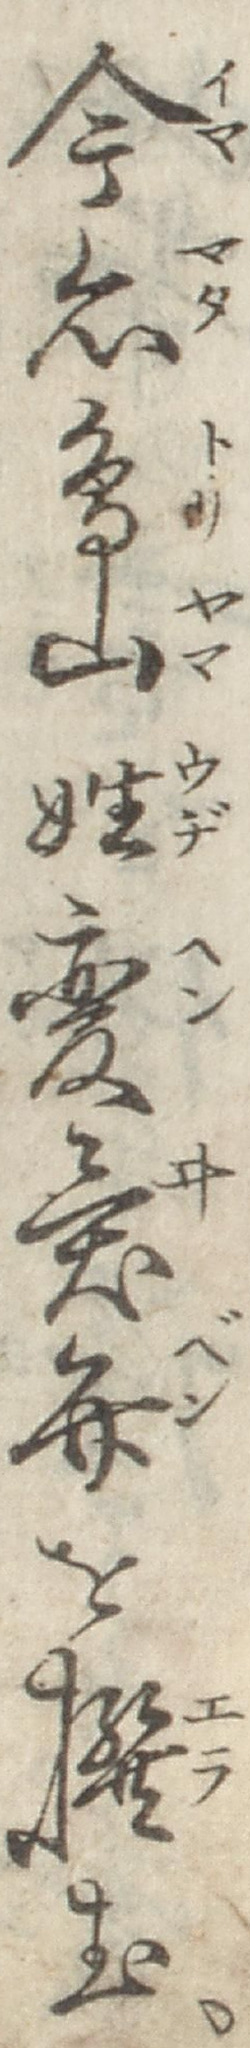今亦鳥山姓変異弁を撰む。

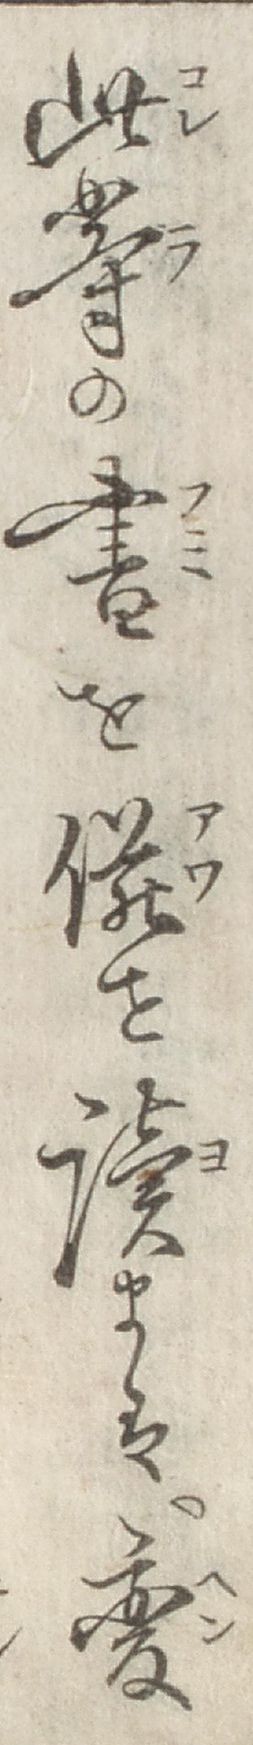此等の書を併せ読まは。変
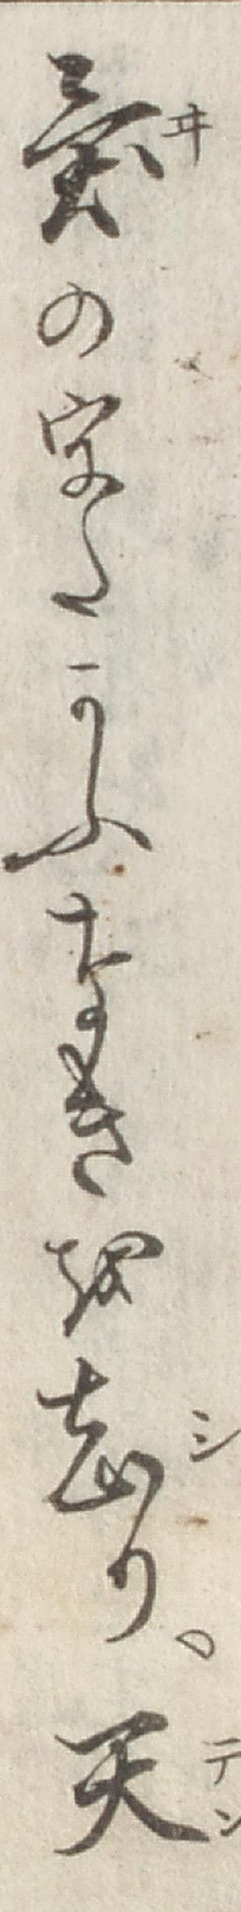異の字たかふなきを知り。天
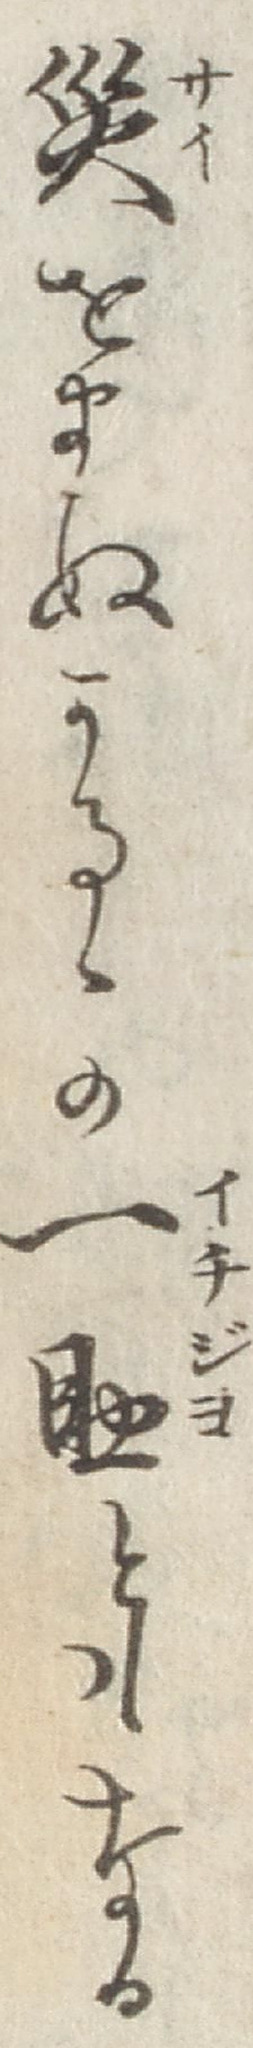災をまぬかるゝの一助ともなる
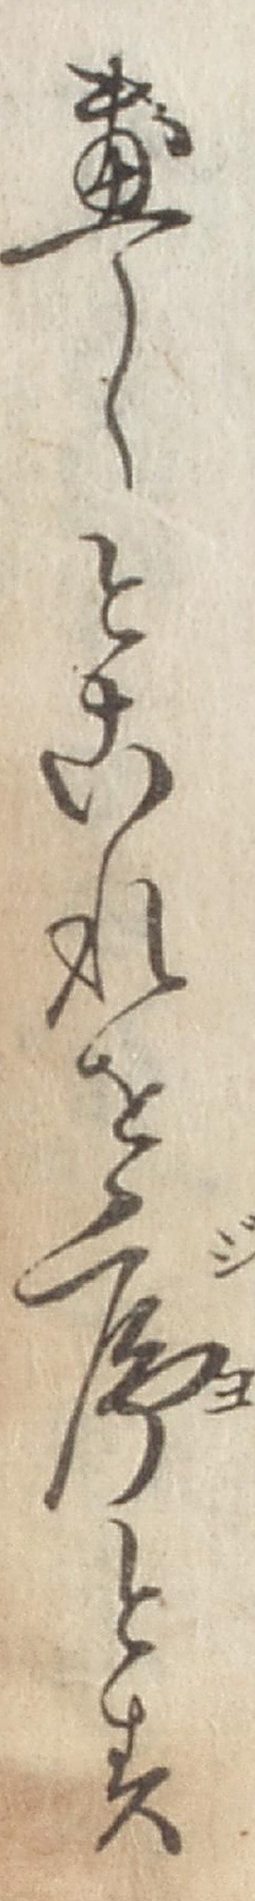へしとこれを序とす
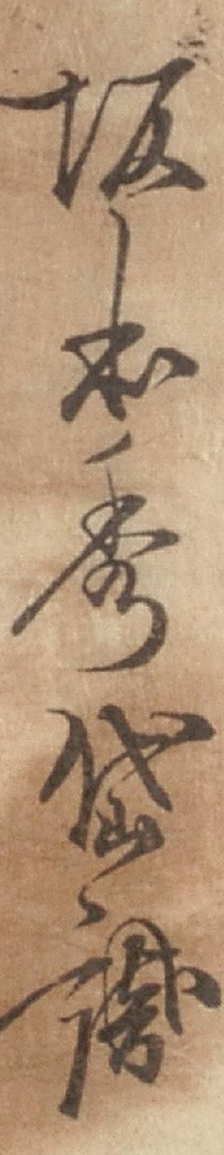坂本秀岱識
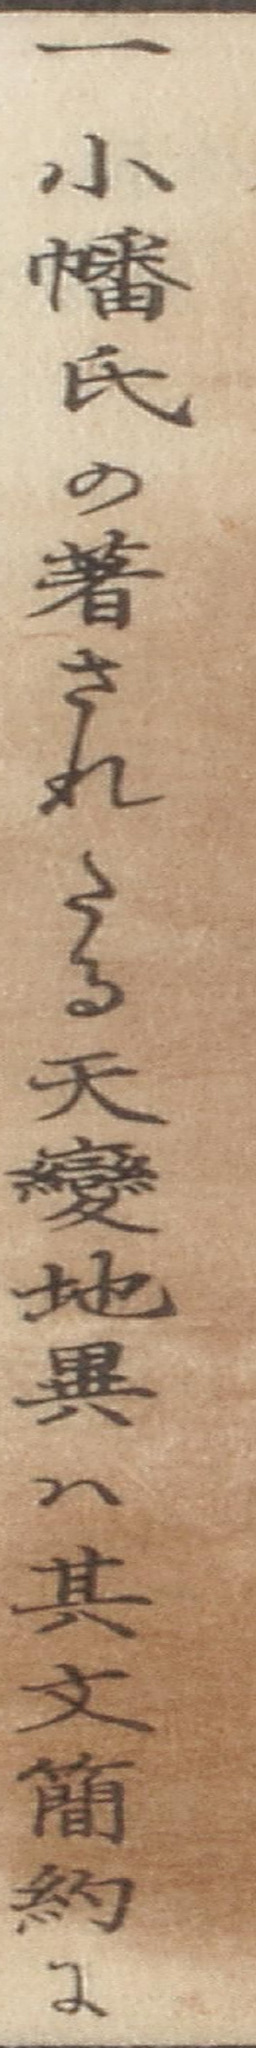一小幡氏の著されたる天変地異は其文簡約に
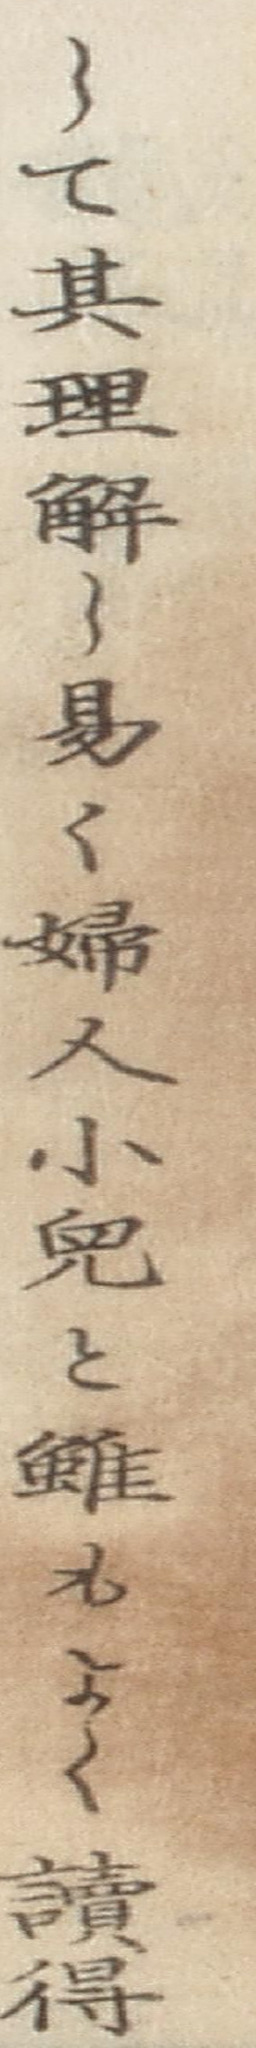して其理解し易く婦人小児と雖もよく読得
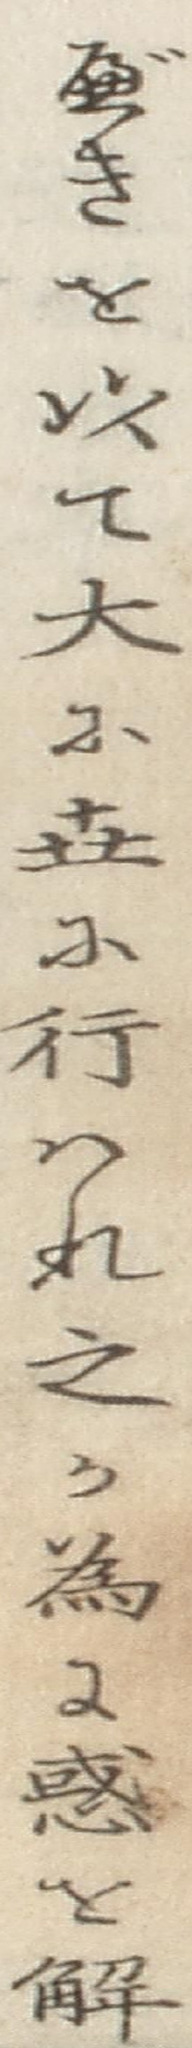べきを以て大に世に行はれ之か為に惑を解
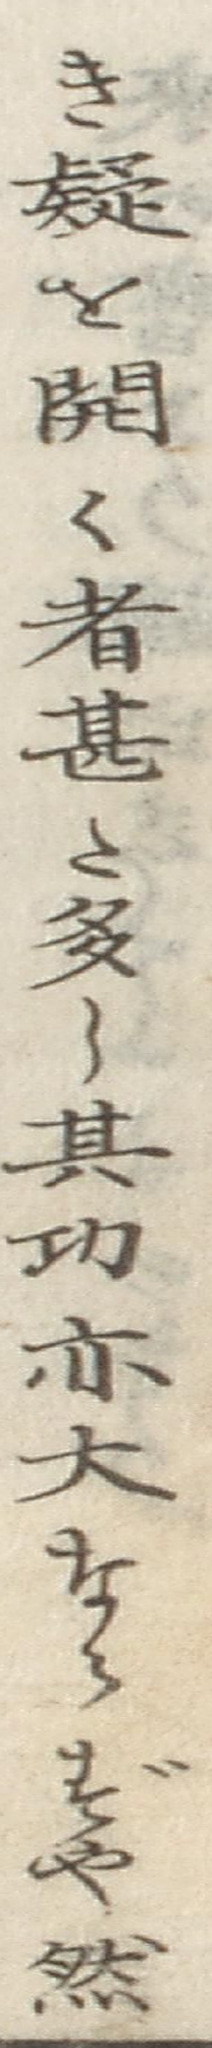き疑を開く者甚た多し其功亦大ならずや然
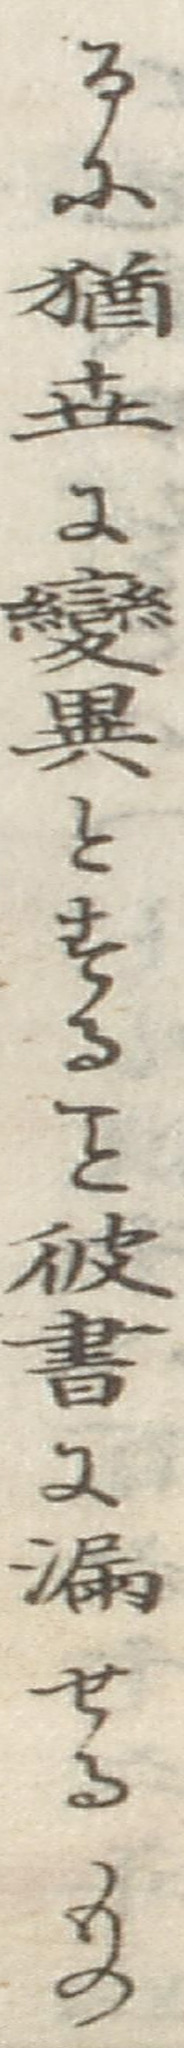るに猶世に変異とすること彼書に漏せるもの
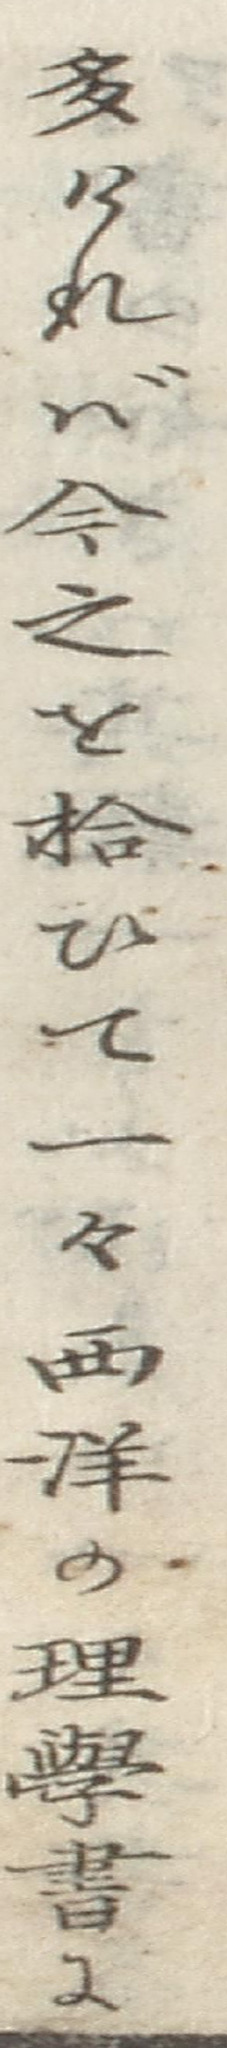多ければ今之を拾ひて一々西洋の理学書に
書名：変異辯　一名、天變地異拾遺　全
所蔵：東京大学地震研究所図書室 Earthquake Research Institute Library, The University of Tokyo, JAPAN
